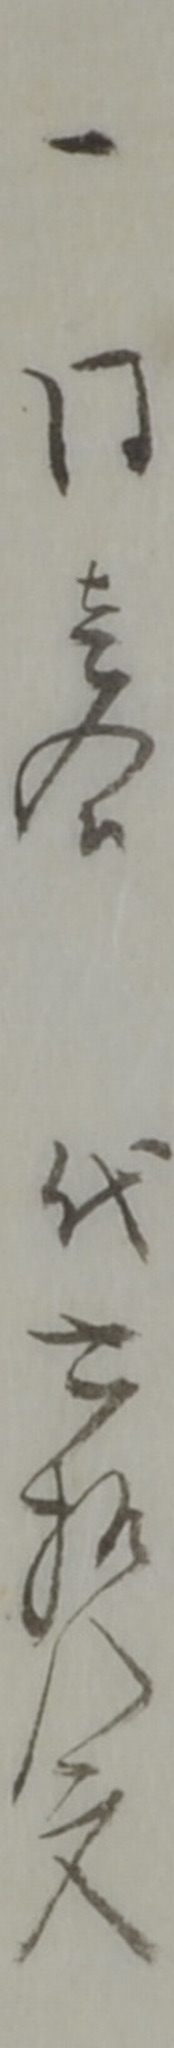一同壱合代六拾八文
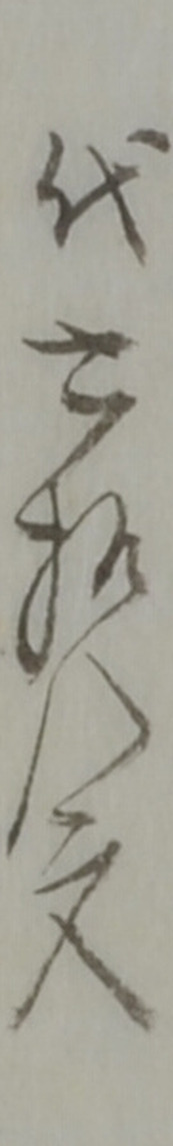代三拾三文
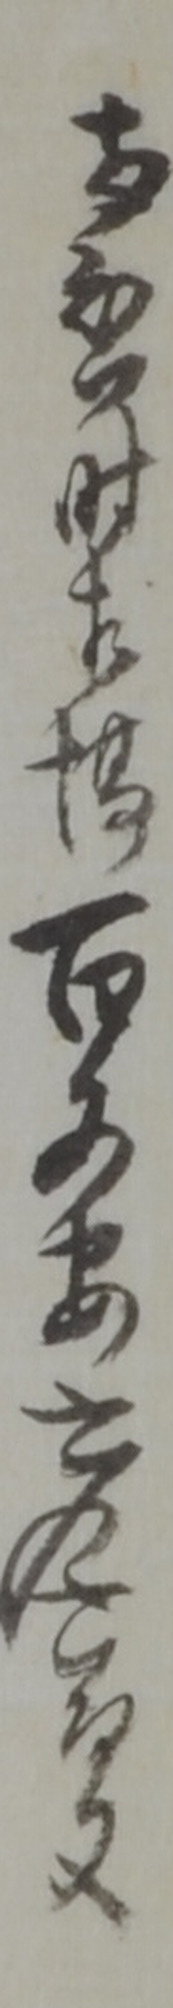両替時相場百文安六〆六百文
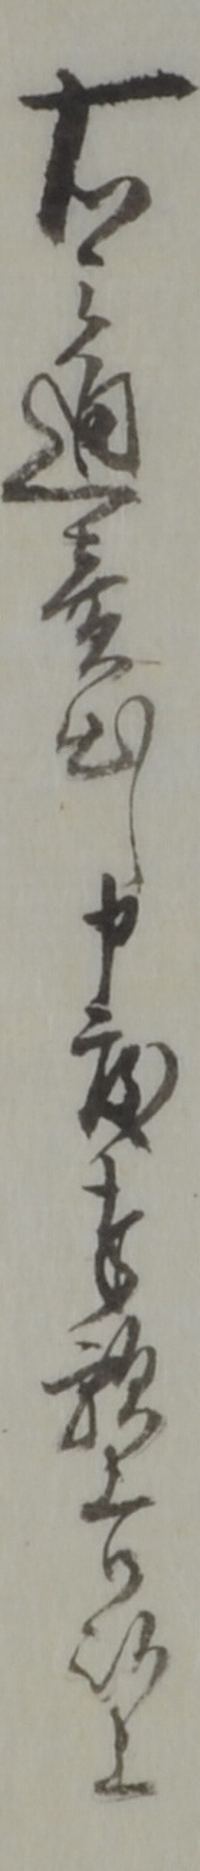右之通売出し申度奉願上候以上
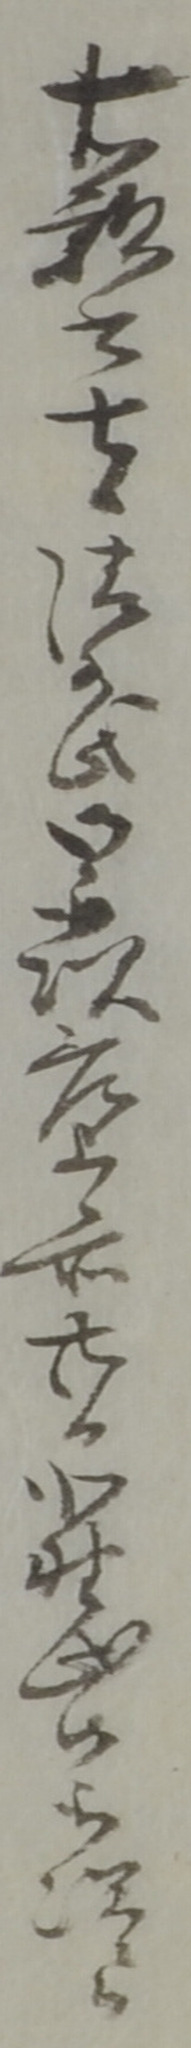右願書七日清水氏御取次差上候所廿日小野氏御取次二而
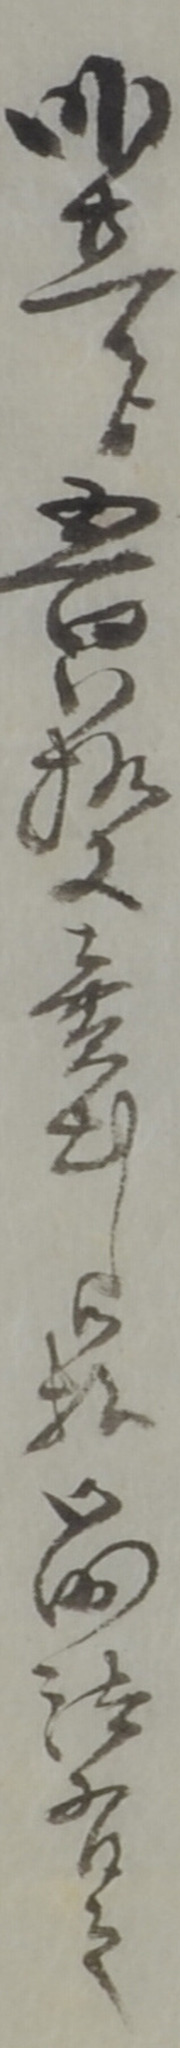明廿一日ゟ五百八拾文売出し候様御沙汰有之
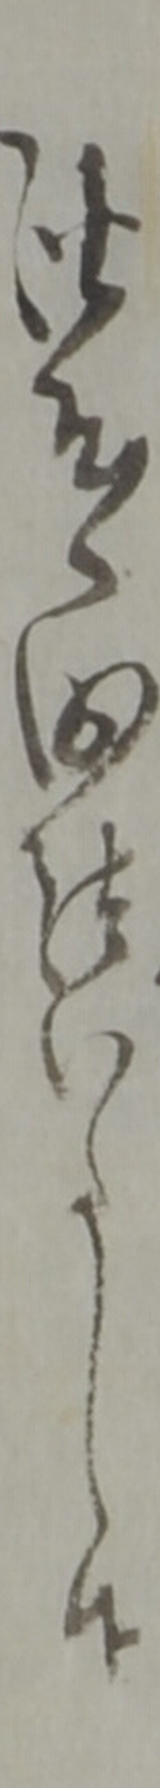油屋へ沙汰いたし候
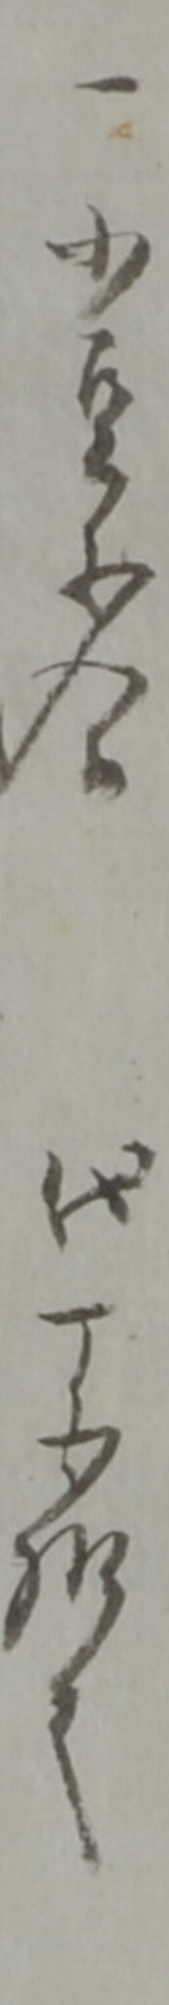一小豆五合代丁五拾文
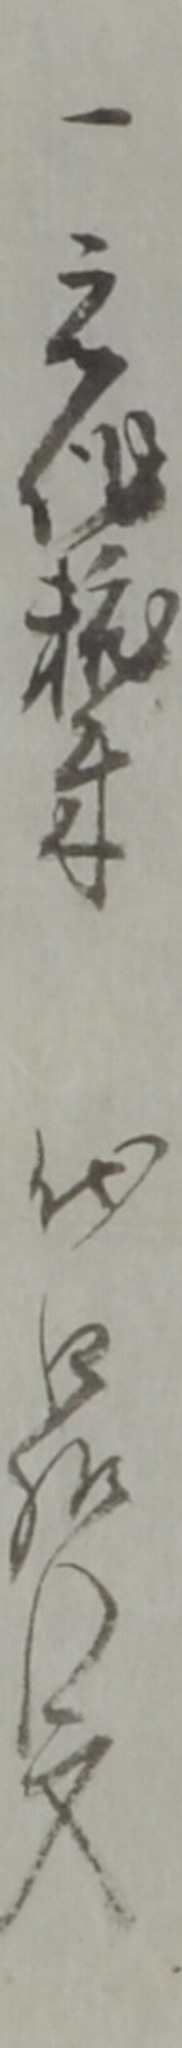一元作糀米代四拾八文
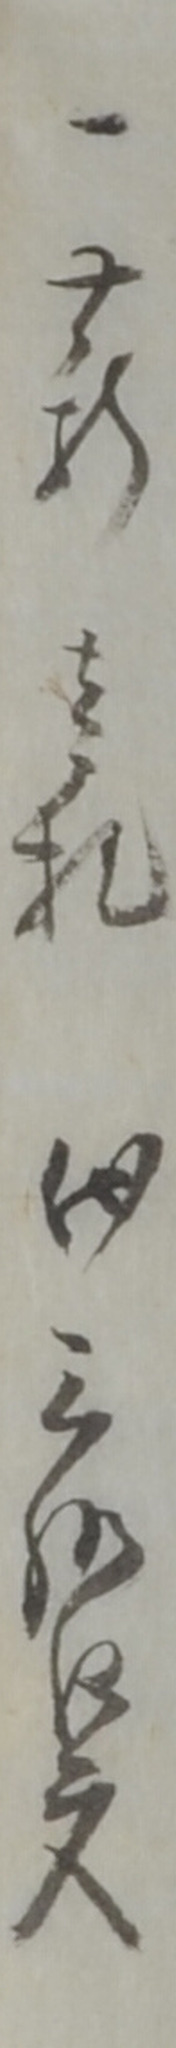一薪壱把代三拾四文
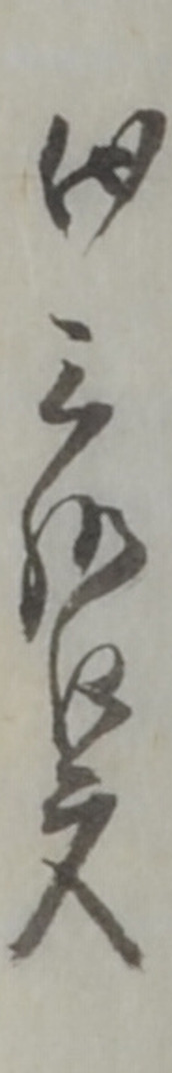代三拾三文

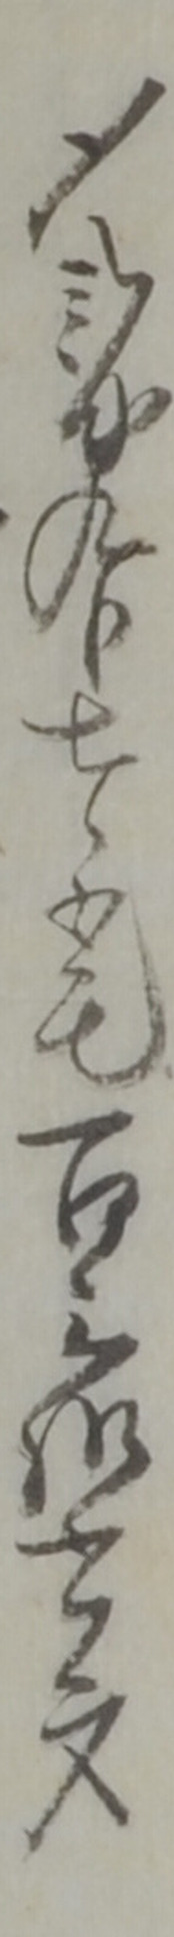〆弐匁九分七厘五毛百三拾六ヵ文
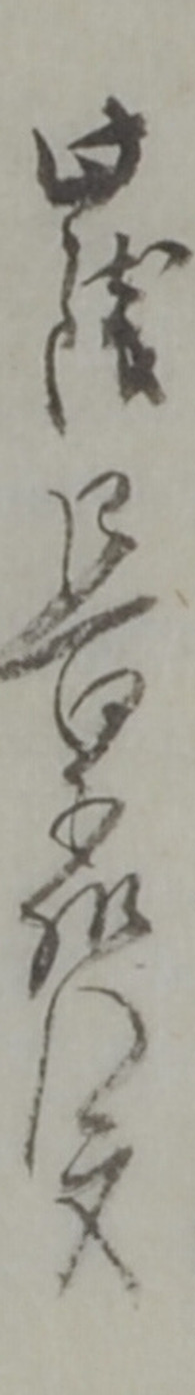此儀四百五拾八文
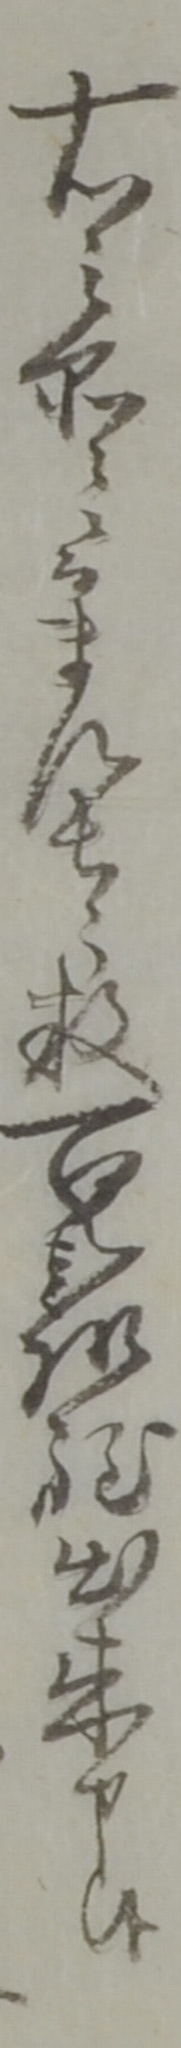右之品ニ而まんちう数百弐拾程出来申候
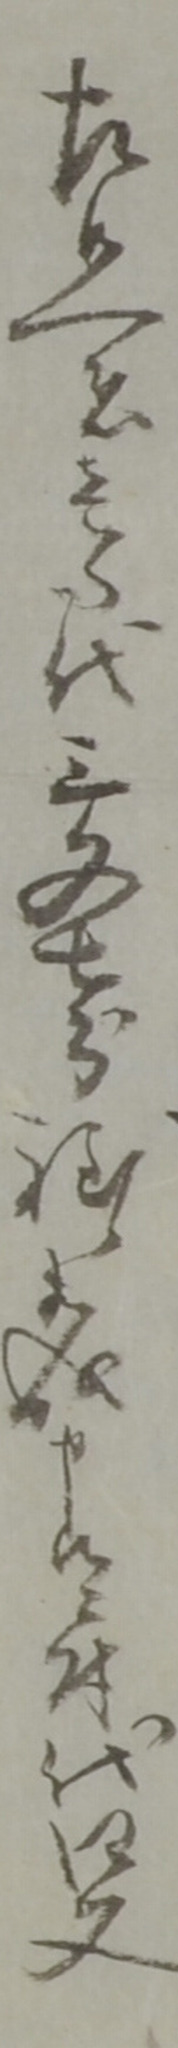左候へ者壱ツ代三文七分程ニ相成申候ニ付代四文
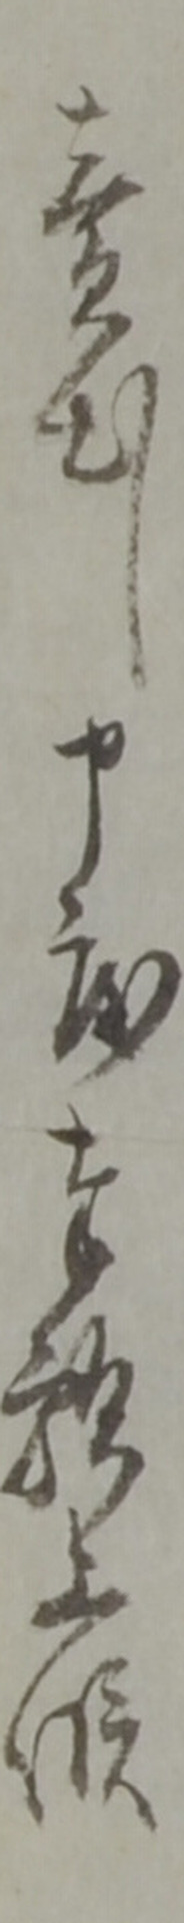売出し申度奉願上候
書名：諸願書控簿
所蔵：伊那市立高遠町図書館・合同会社AMANE
